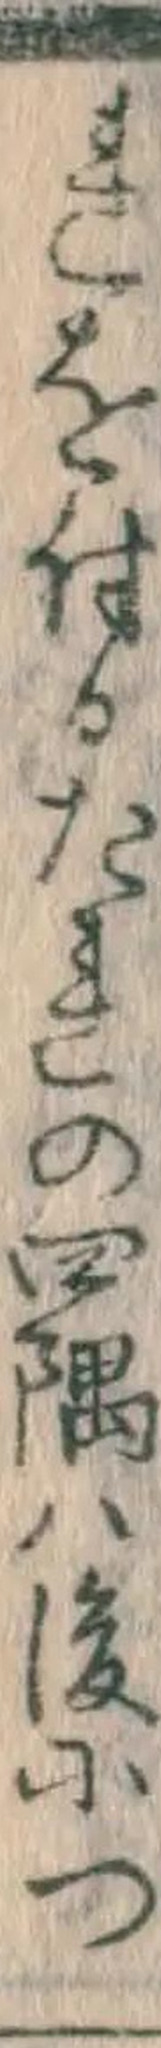れを付るたれの四隅は後につ
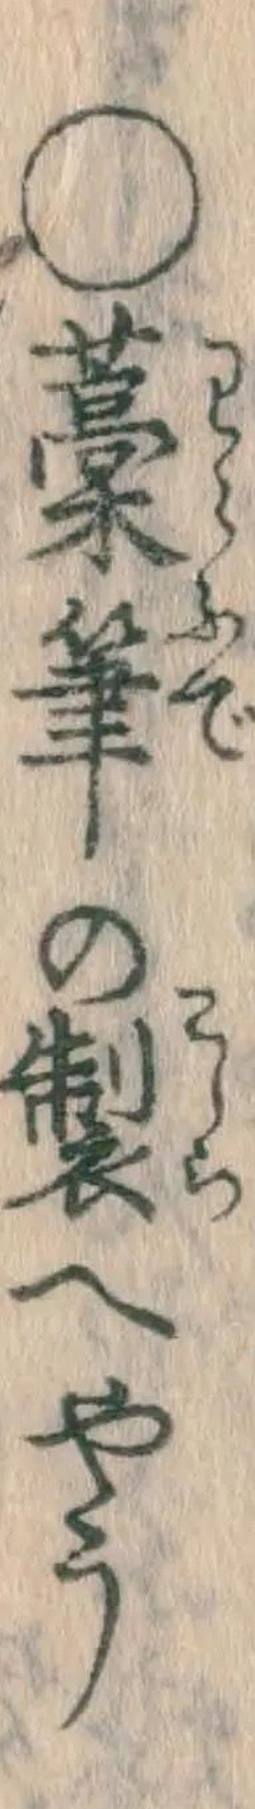○藁筆の製へやう
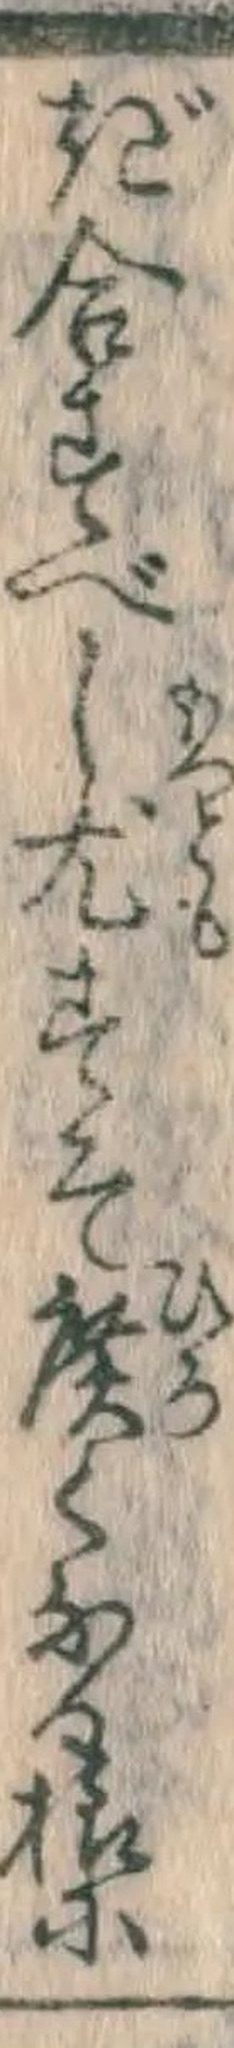ぎ合すべし尤すそ広くなる様に
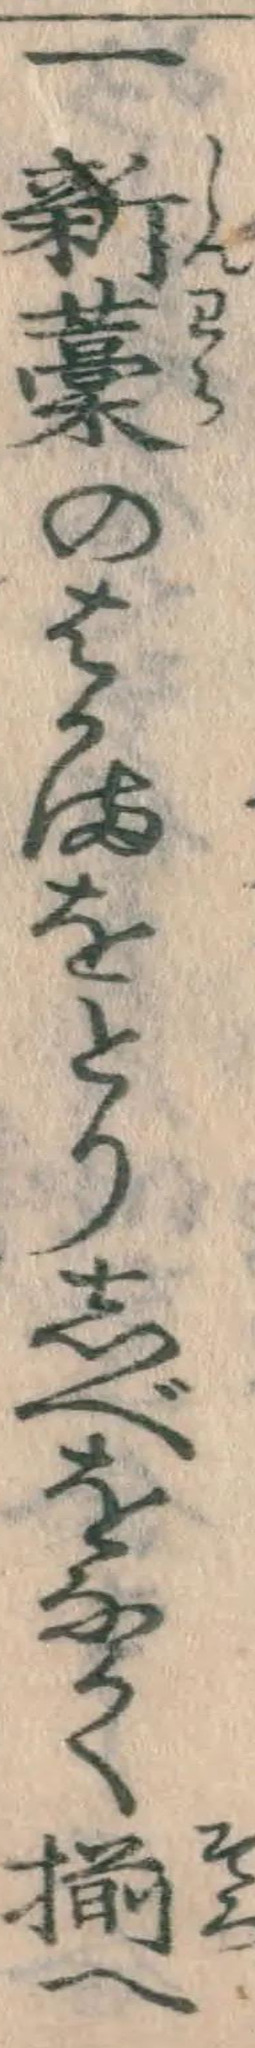一新藁のはかまをとりしべをなかく揃へ
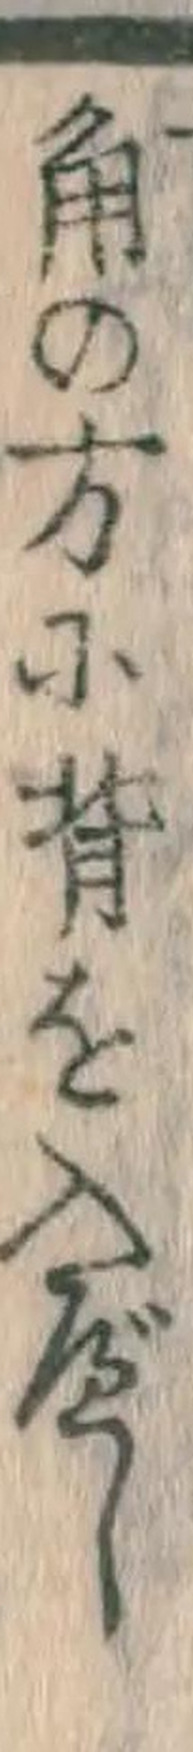角の方に背を入べし
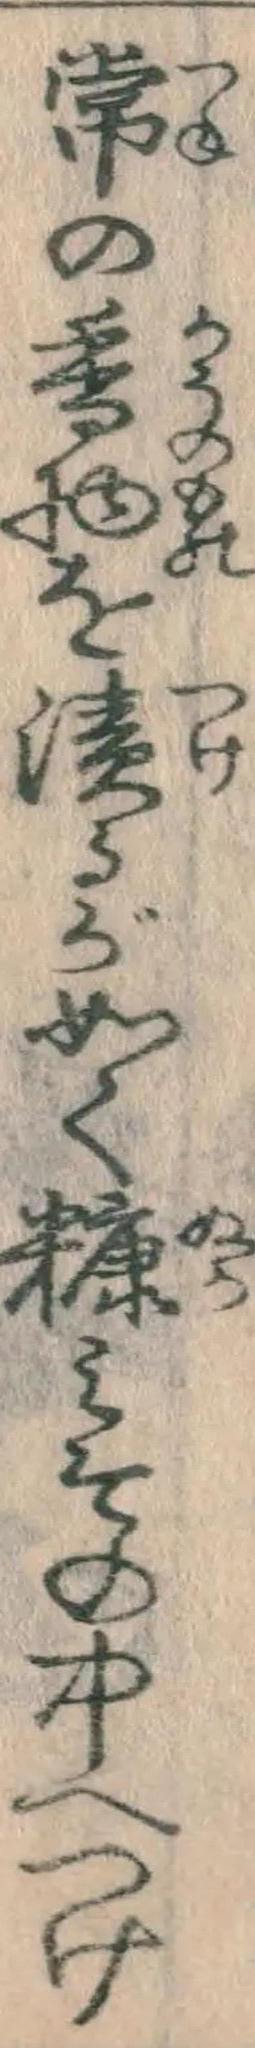常の香物を漬るが如く糠みその中へつけ
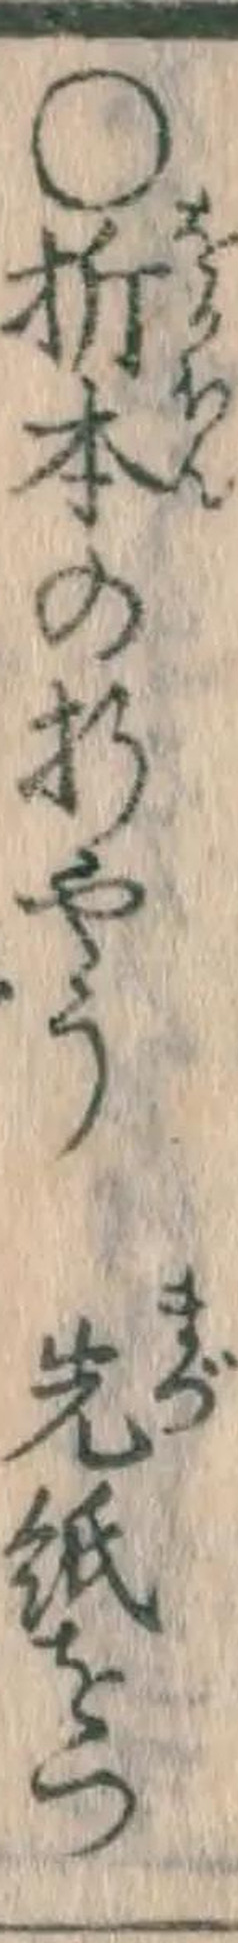○折本の折やう先紙をつ
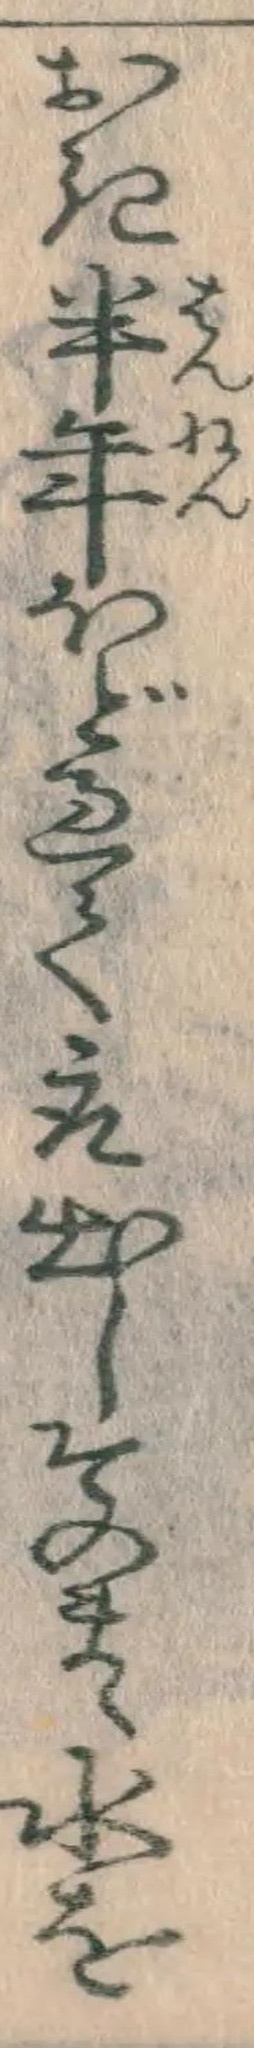おき半年ほどへて取出しそのまゝ水を
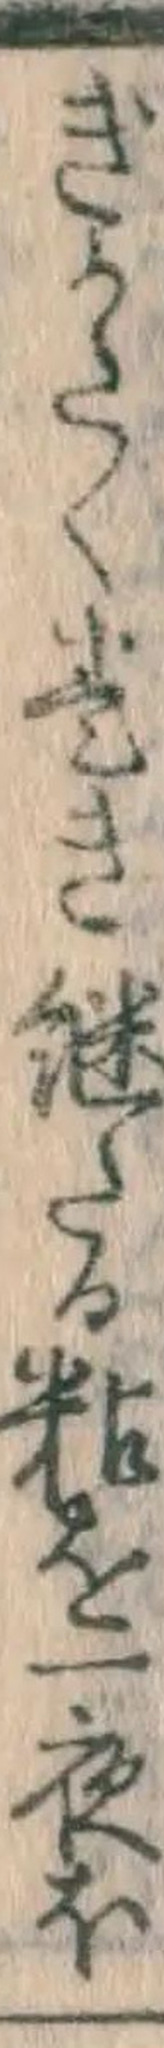ぎかたく巻き継たる粘を一夜ほ
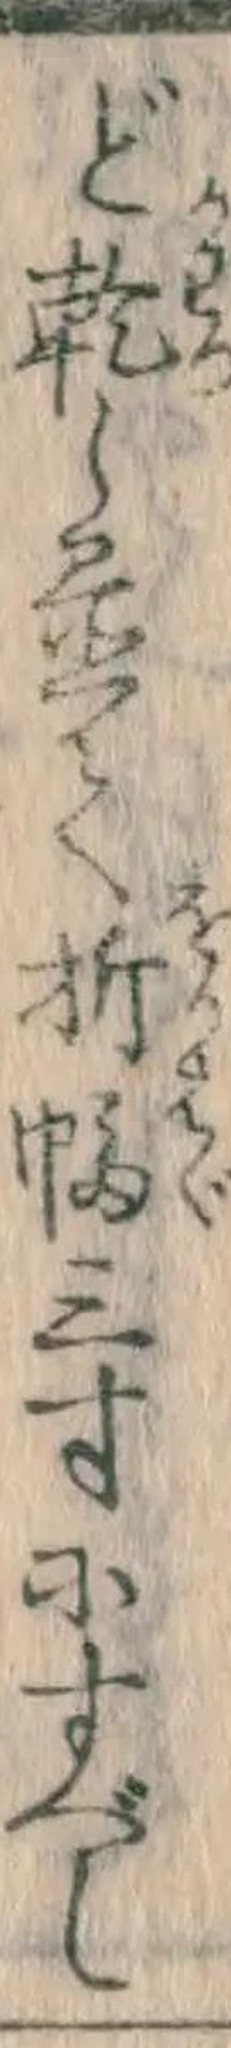ど乾し置て折幅三寸にすべし
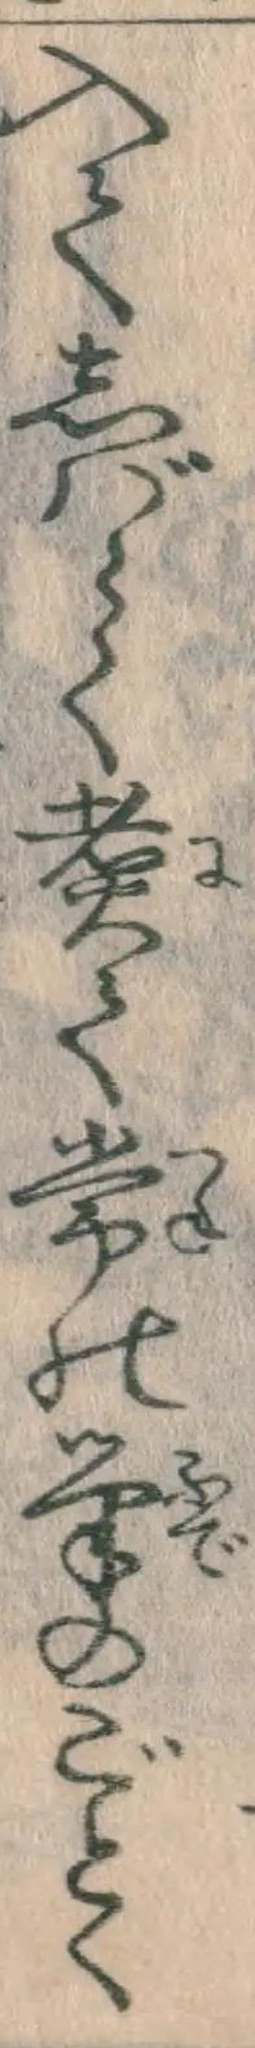入てしばらく煮て常の筆のごとく
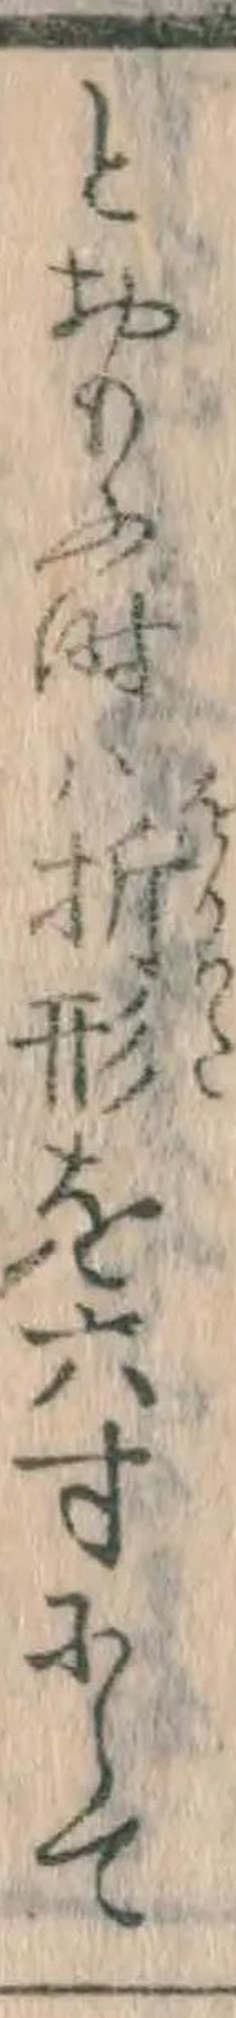とおもふ時は折形を六寸にして
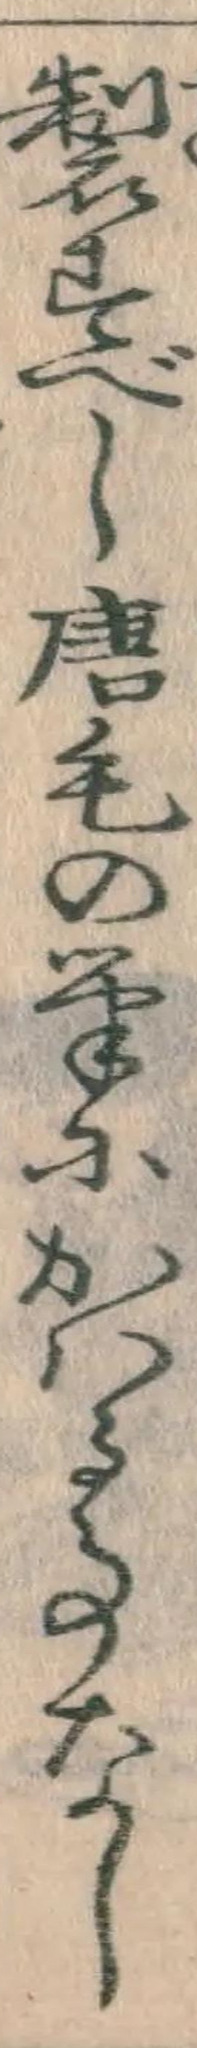製すべし唐毛の筆にかはる事なし
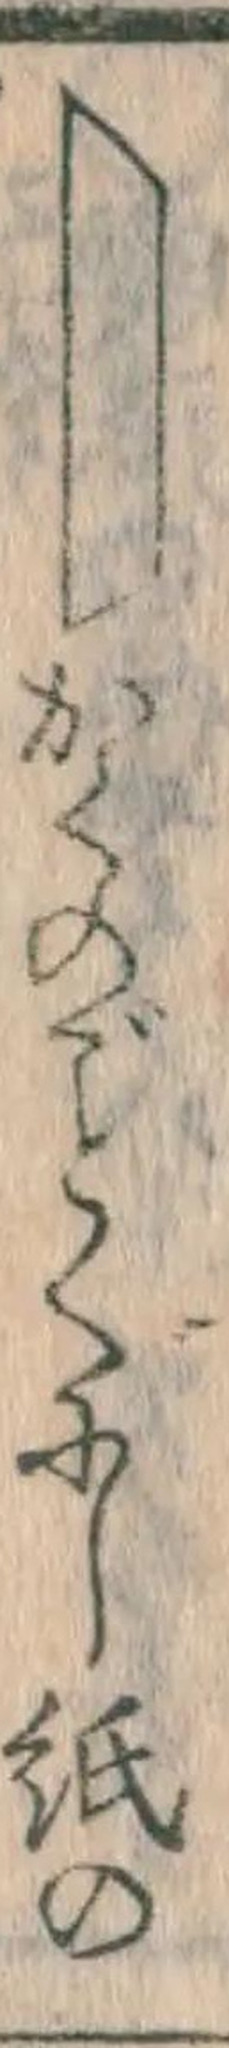かくのごとくにし紙の
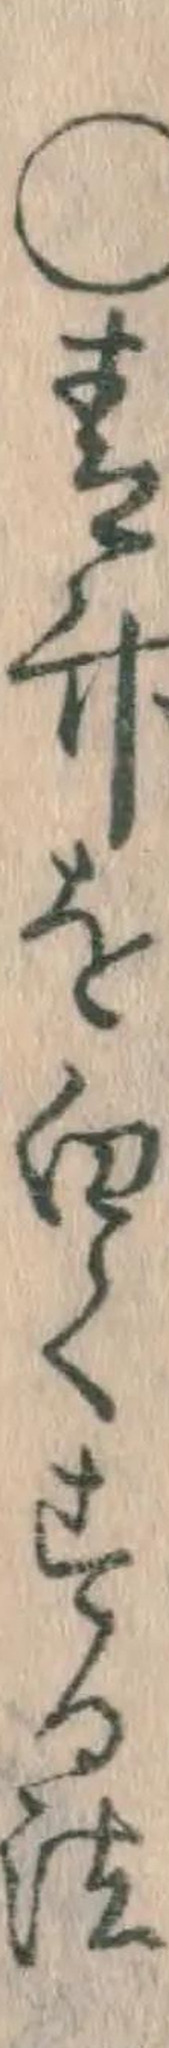○青竹を白くする法
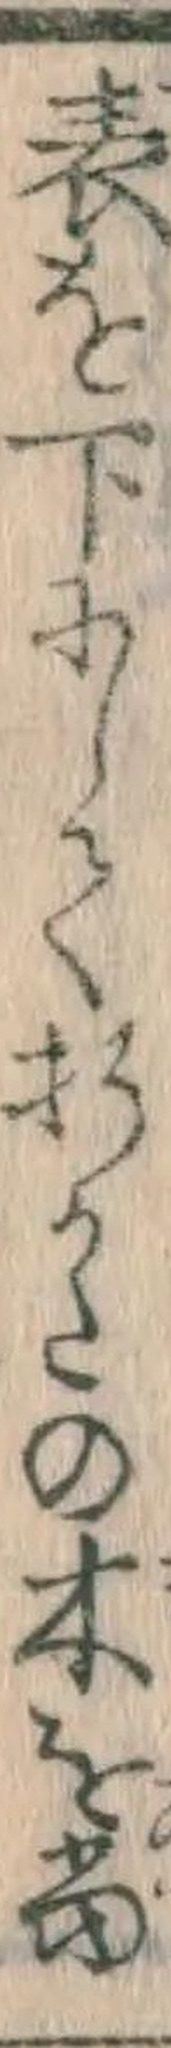表を下にして折かたの木を当
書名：広益秘事大全 3巻. [2]
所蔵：国立国会図書館 National Diet Library, JAPAN
